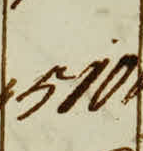510
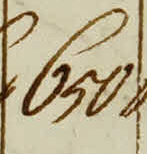650
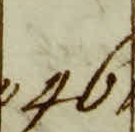46
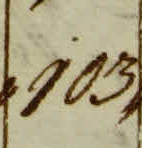103
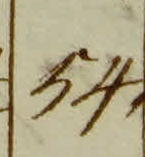54
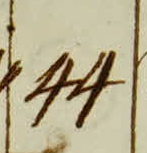44
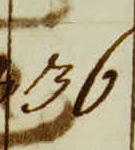36
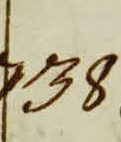38
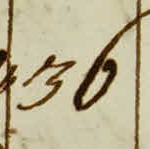36
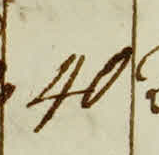40
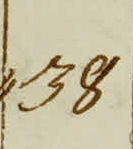38
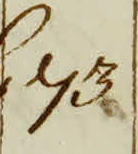73
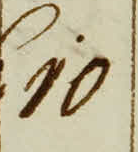10
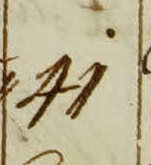41
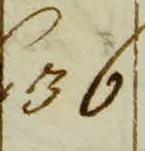36
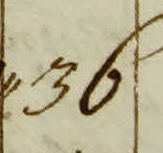36
